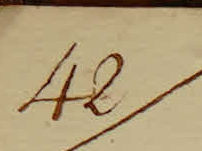42
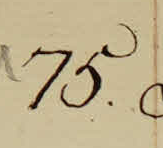75.
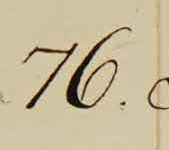76.
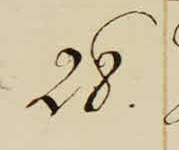28.
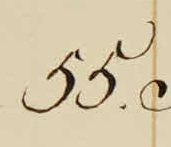55.
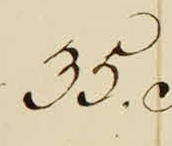35.
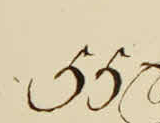55.
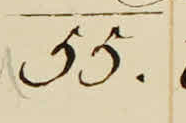55.
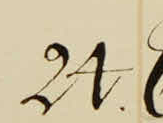24.
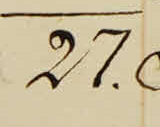37.
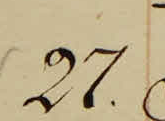27.
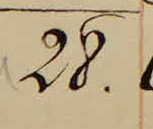28.
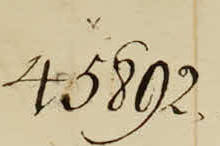45892
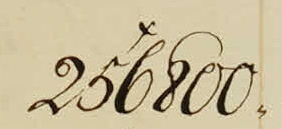256800
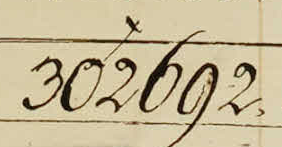302692
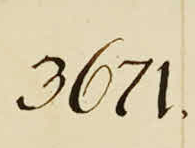3671
